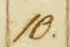10.
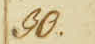30.
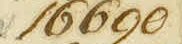16690
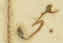5.
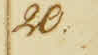20.
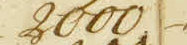2000.
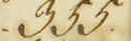355.
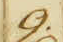9.
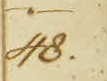48.
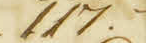117.
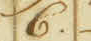6.
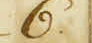6.
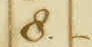8.
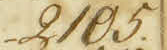2105.
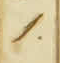1.
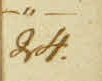24.
